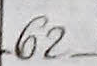62
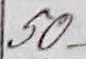50
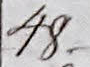48
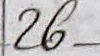26
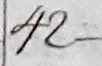42
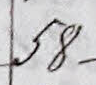58
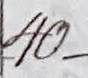40
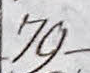79
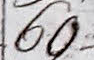60
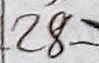28
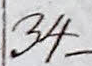34
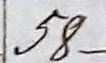58
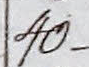40
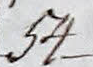54
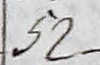52
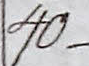40
